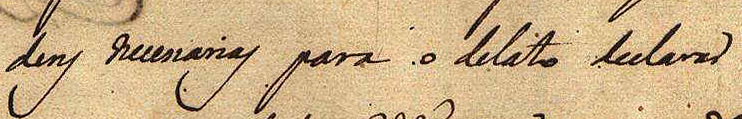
dens necessarias para o delato declarar
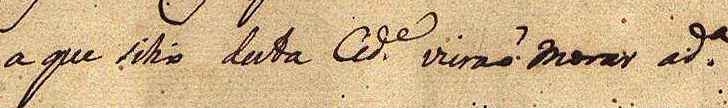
a que sitio desta Cid.e vieraõ morar a d.a
